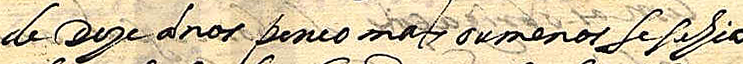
de Doze ānos pouco mais ou menos se sahio
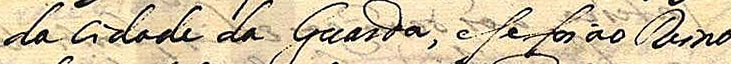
da cidade da Guarda, e se foi ao Reino
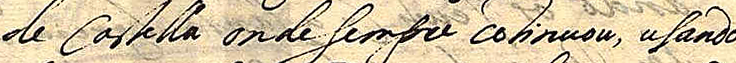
de Castella onde sempre cōtinuou, usando
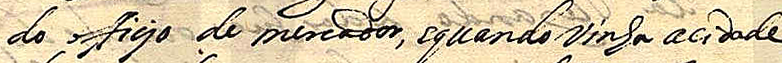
do officjo de mercador, E quando vinha a cidade
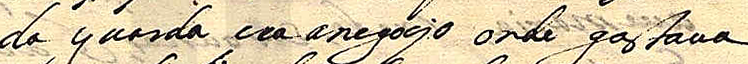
da guarda era a negocjo onde gastaua
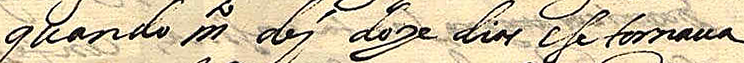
quando mto dez doze dias E se tornaua
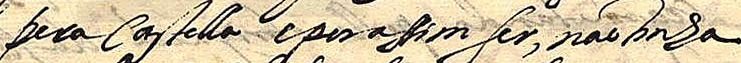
pera Castella E por assim ser, naõ tinha
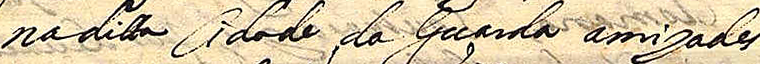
na ditta Cidade da Guarda amizades
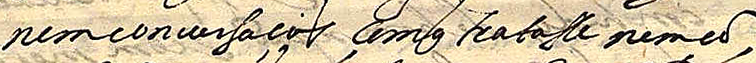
nem conuersaçoĩs com que tratasse nem cō
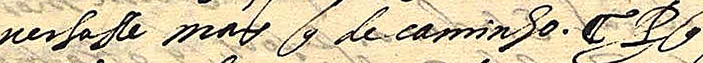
uersasse mais q̄ de caminho. ¶ Ꝓ q̄
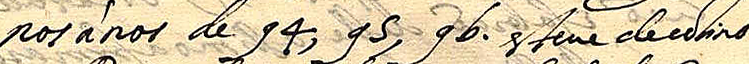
nos ānos de 94, 95, 96. esteue de cōtino
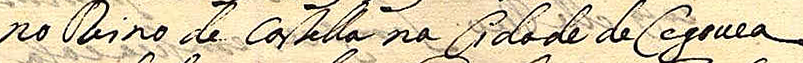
no Reino de Castella na Cidade de Cegouea
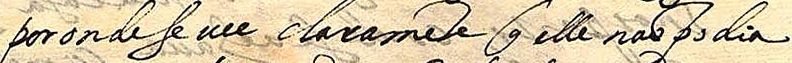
por onde se uee claramēte q̄ elle naõ podia
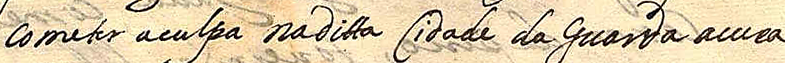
cometer a culpa na ditta Cidade da Guarda auera
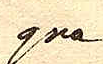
qua
